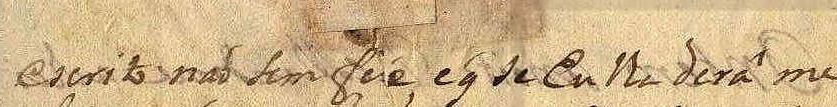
escrito naõ tem feé, e q̄ se Eu lha derâ me
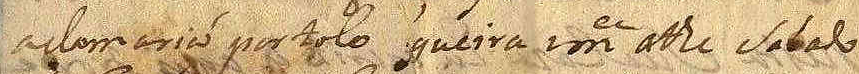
aclamariaõ por tolo queira vmce athe Sabado
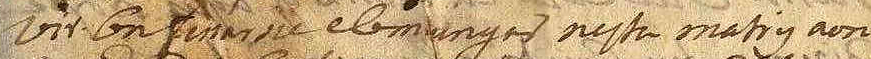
vir Confessarsse e Comungar nesta matris aon
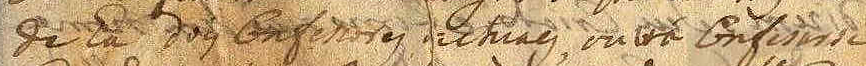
de ha dois Confessores actuaes, ou vá confesarse
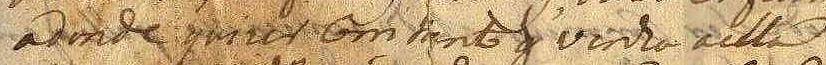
adonde quizer comtanto q̄ venha a ella
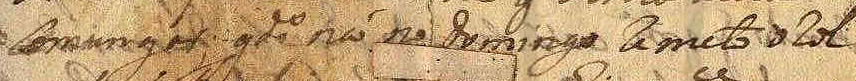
Comungar; qdo naõ no Domingo Remeto o Rol
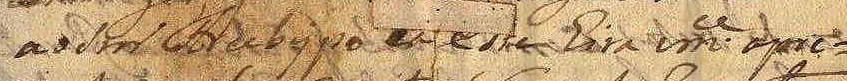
ao Snr Arcebispo e a este hira vm.ce apre
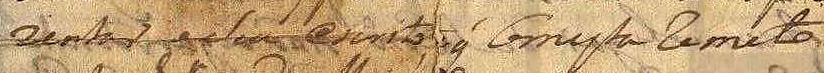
zentar o seu escrito, q̄ Com esta Remeto
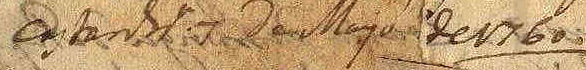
Castanhr.o 7 de Mayo de 1760
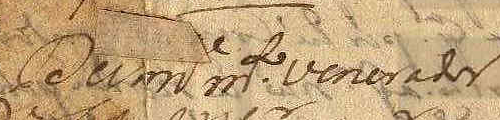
De vme m.to venerador
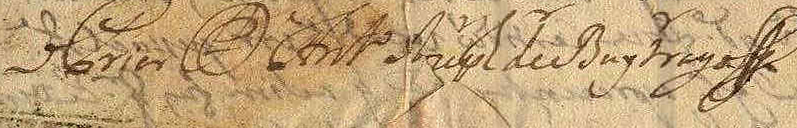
o Prior Pe Ant.o Iozeph de Buytrago
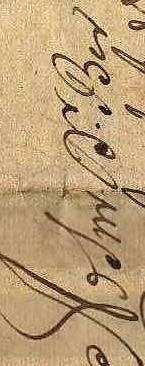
Ao snr. D.r Ber
